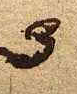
3
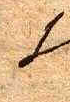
1
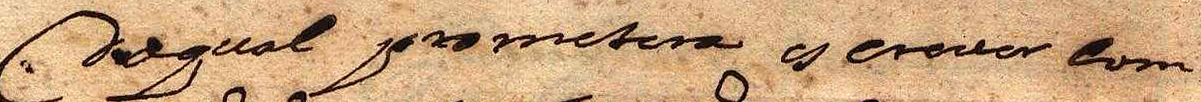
do qual prometera escrever com
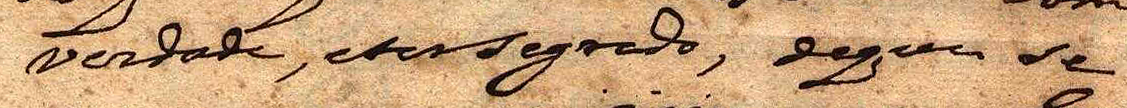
verdade, e ter segredo, de que se
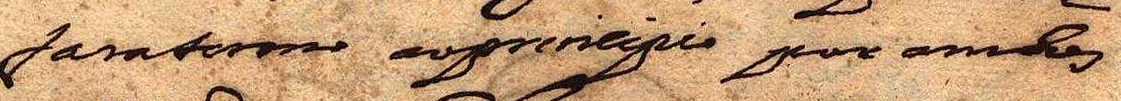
fara termo ao principio por ambos
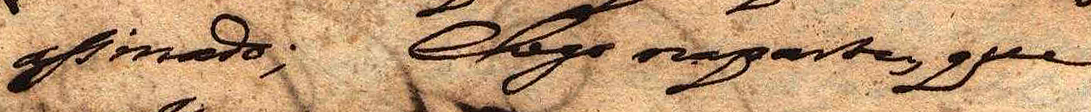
assinado; E logo na parte que
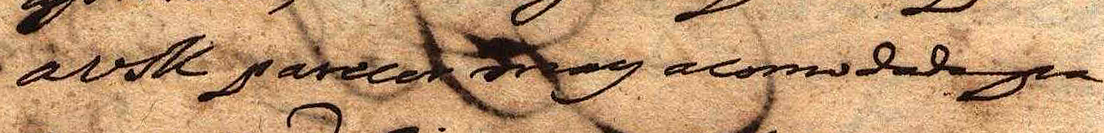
a v M parecer maes acomodada pa
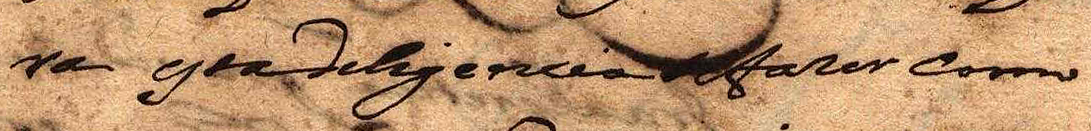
ra esta deligencia se fazer como
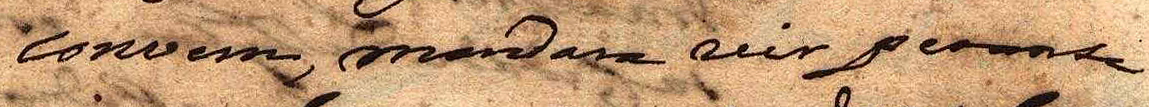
convem, mandara vir perante
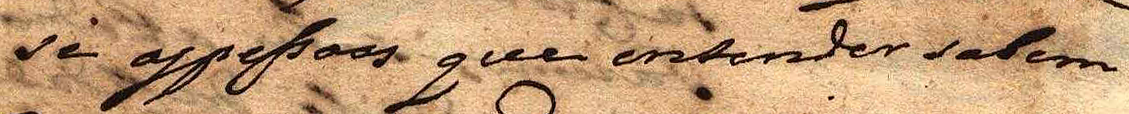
si as pessoas que entender sabem
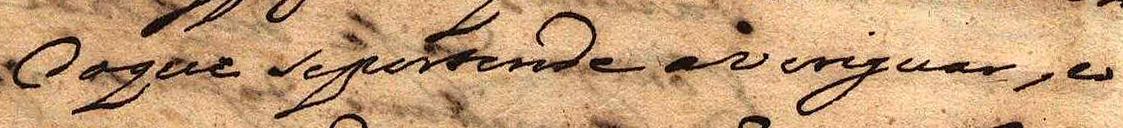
do que se pertende averiguar, e o
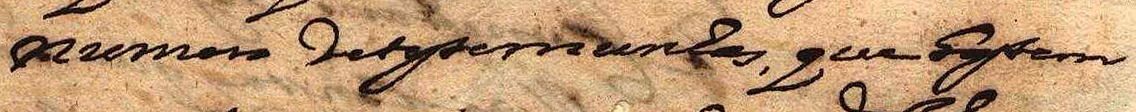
numero de testemunhas, que bastem
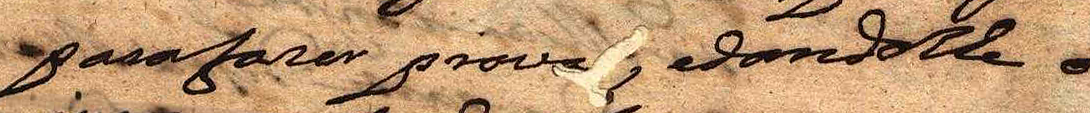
para fazer prova, e dandolhe o
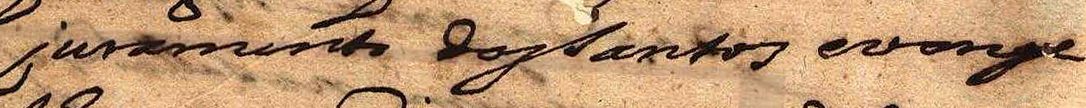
juramento dos Santos evange
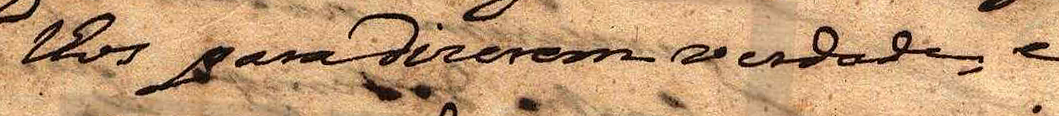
lhos para dizerem verdade, e
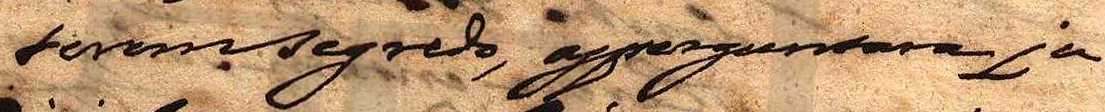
terem segredo, as perguntara ju
